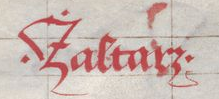.Żaltarz.
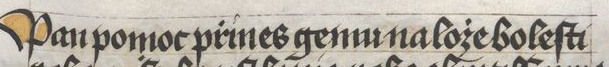Pan pomoc pṙines gemu naloże boleſtí
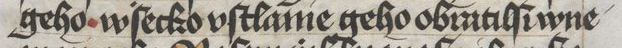geho.wẛecko vſtlaníe geho obratilſi wne¬
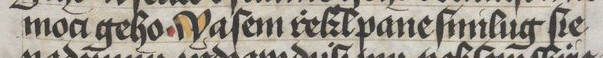moci geho.Vaſem ṙekl pane ſmilug ſie
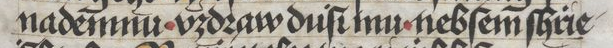nademnu.vzdraw duẛi mu.nebſem ſhṙie¬
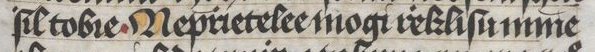ẛil tobie.Nepṙietelee mogi ṙekliſu mnie
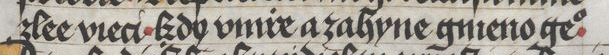zlee vieci.kdy vmṙe a zahyne gmeno geo.
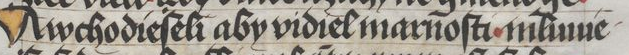Awchodíeẛeli aby vidiel marnoſti.mluuíe¬
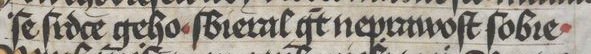ẛe ſrdce geho.ſbieral ḡt neprawoſt ſobie.
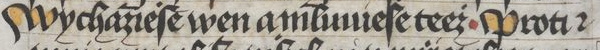Wychazieẛe wen a miluuíeẛe teež.Proti
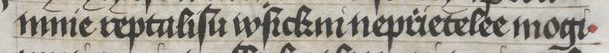mnie reptaliſu wẛickni nepṙíetelee mogi.
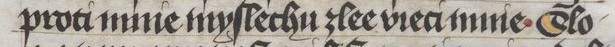proti mine myſlechu zlee vieci mnie.Slo¬
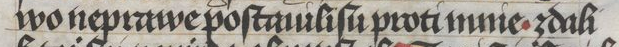wo neprawe poſtauiliſu proti mnie.zdali
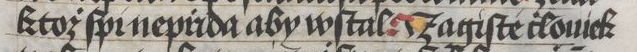ktož ſpí nepṙida aby wſtal.Zagiſté ċlouiek
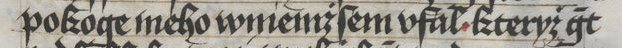pokoge meho wníemżſem vſal.kteryž ḡt
